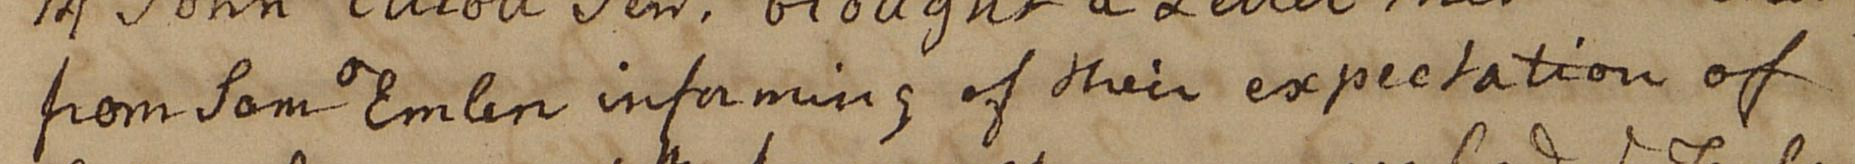from Sam^l Emlen informing of their expectation of
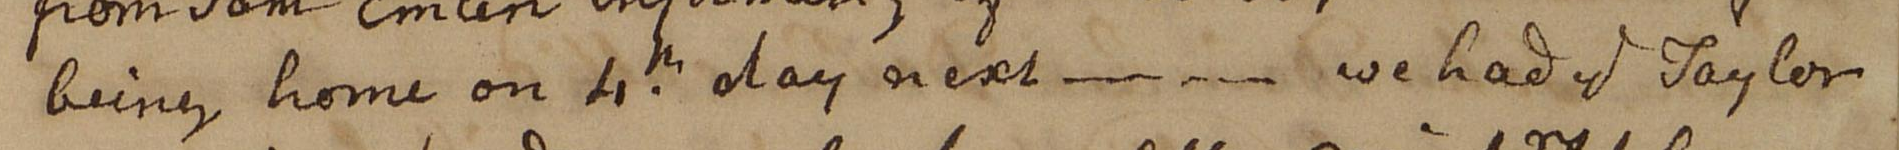being home on 4^th. day next--- we had y^e Taylor
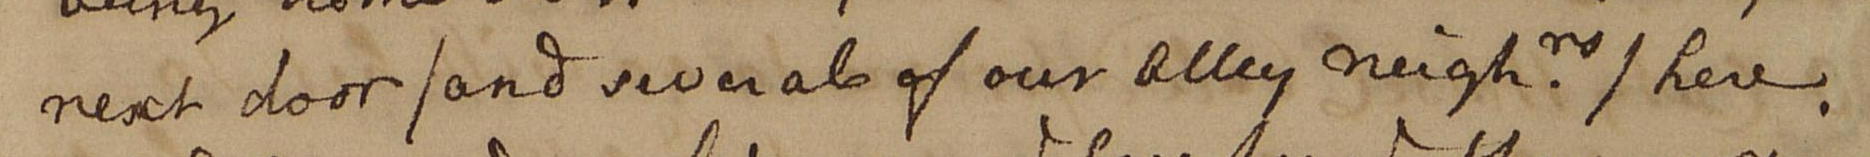next door /and several of our alley neigh^rs./ here,
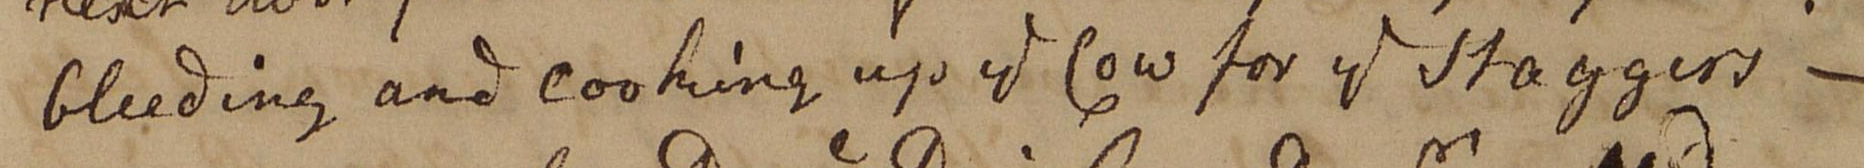bleeding and cooking up y^e Cow for y^e Staggers-
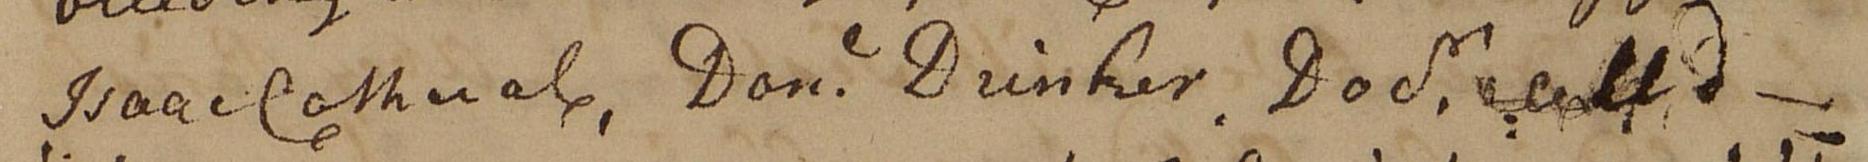Isaac Catheral, Dan^l. Drinker. Doc^r. call'd-
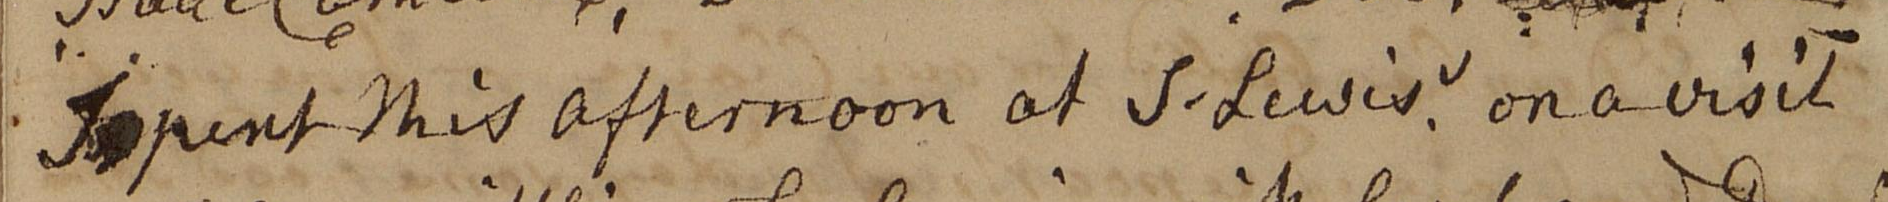Ispent this afternoon at S: Lewis^s. on a visit
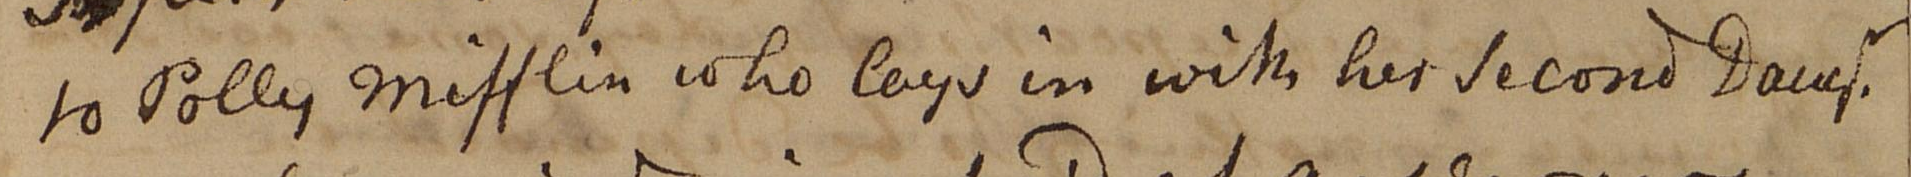to Polly Mifflin who lays in with her second Daug^r.
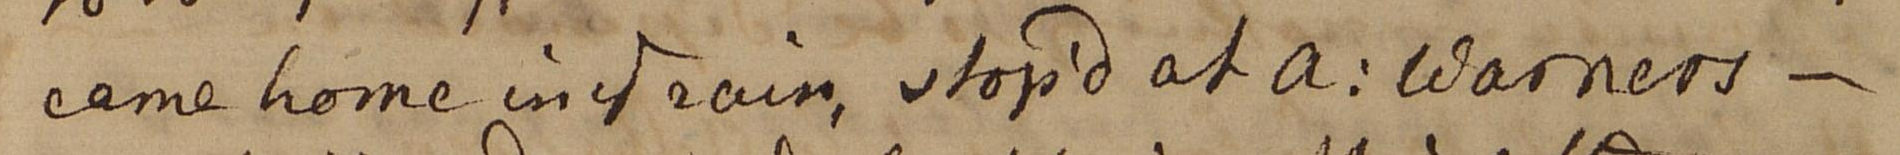came home in y^e rain, stop'd at A: Warners-
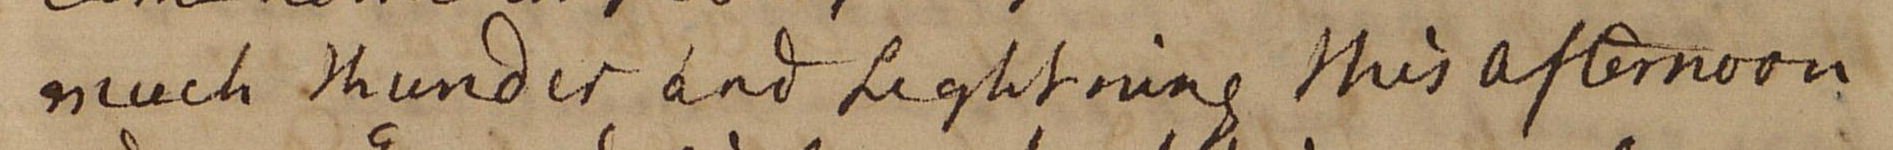much thunder and Lightning this afternoon
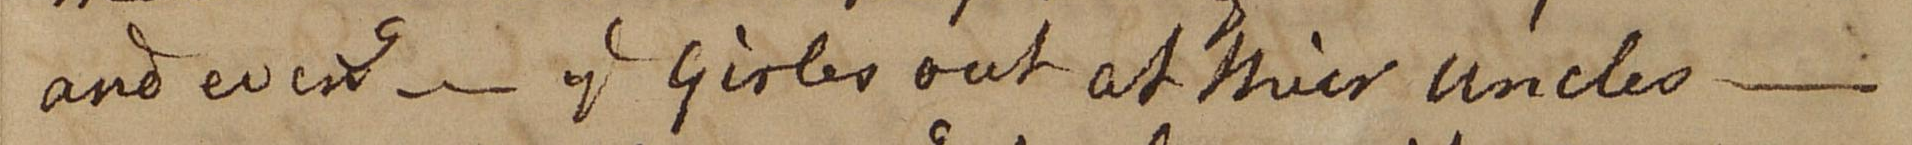and even^g- y^e Girles out at thier Uncles-
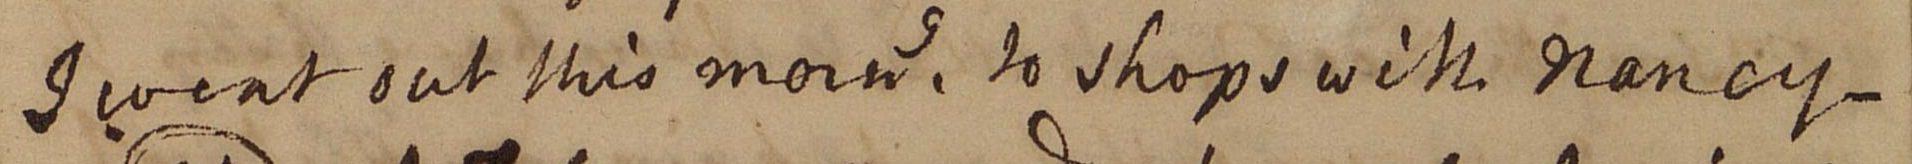I went out this morn^g. to shops with Nancy-
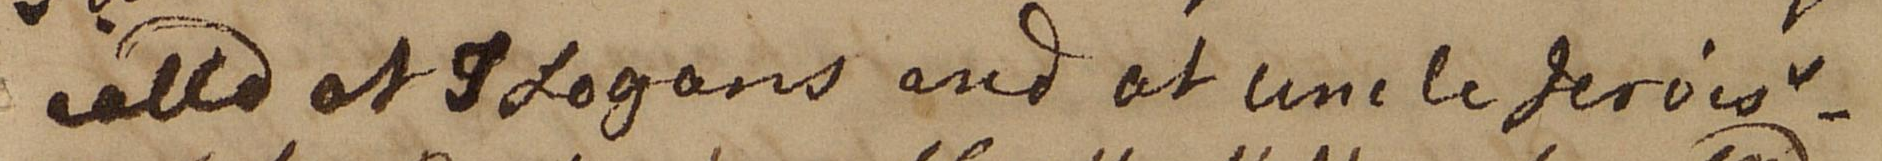call'd at T Logans and at Uncle Jervis^s-
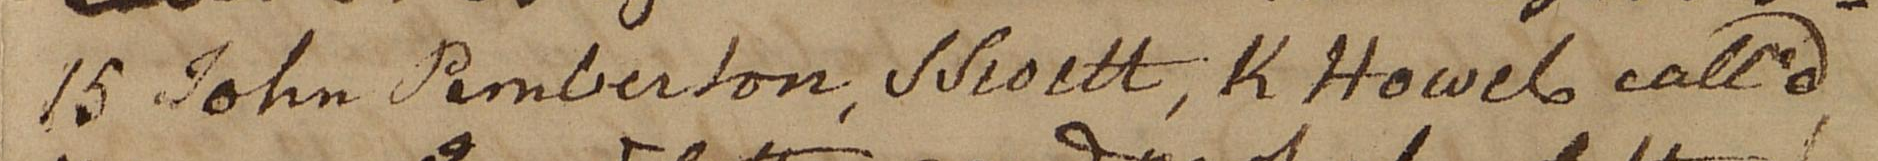15 John Pemberton, SSwett, K Howel call'd
